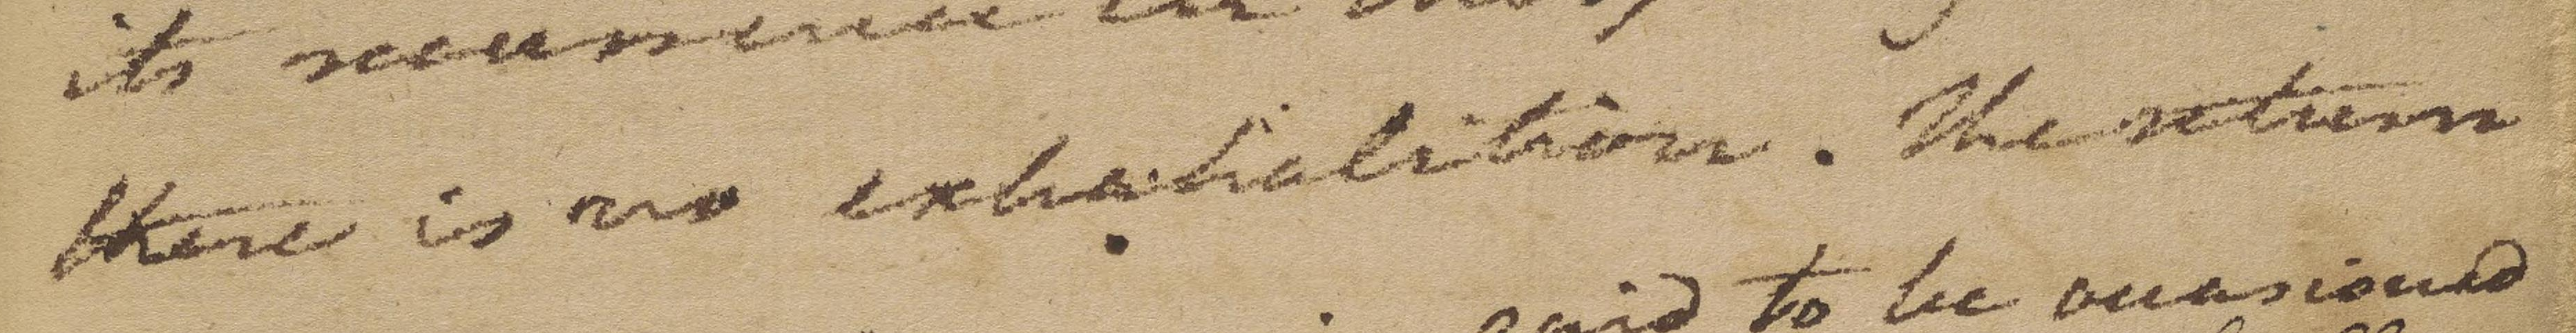there is no exhalations. The return
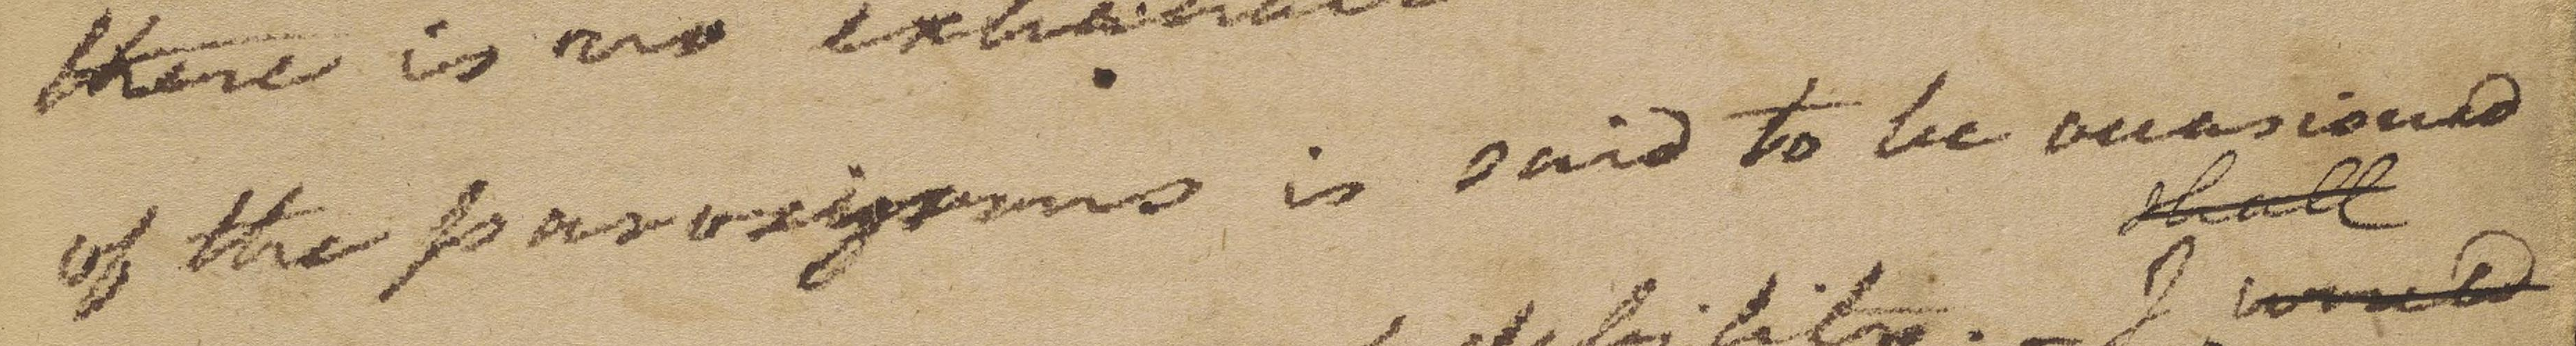of the paroxysms is said to be occasioned
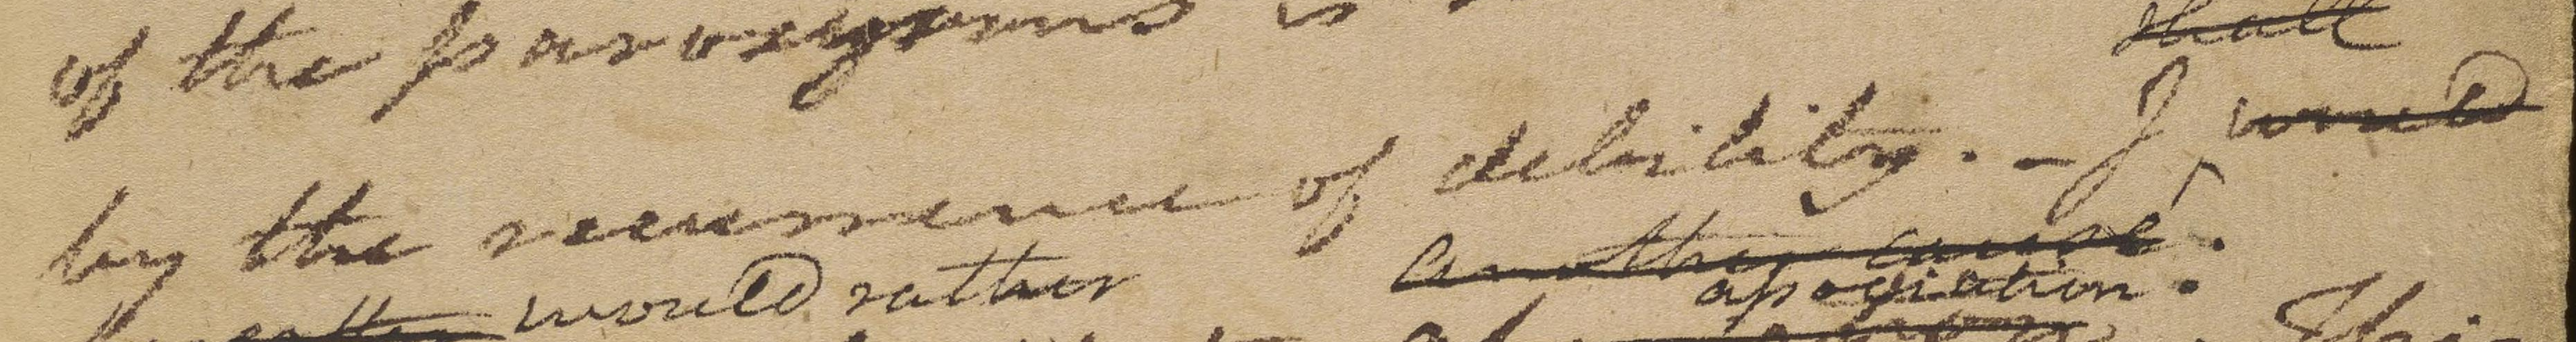by the renumerance of debility. I ^ [would]
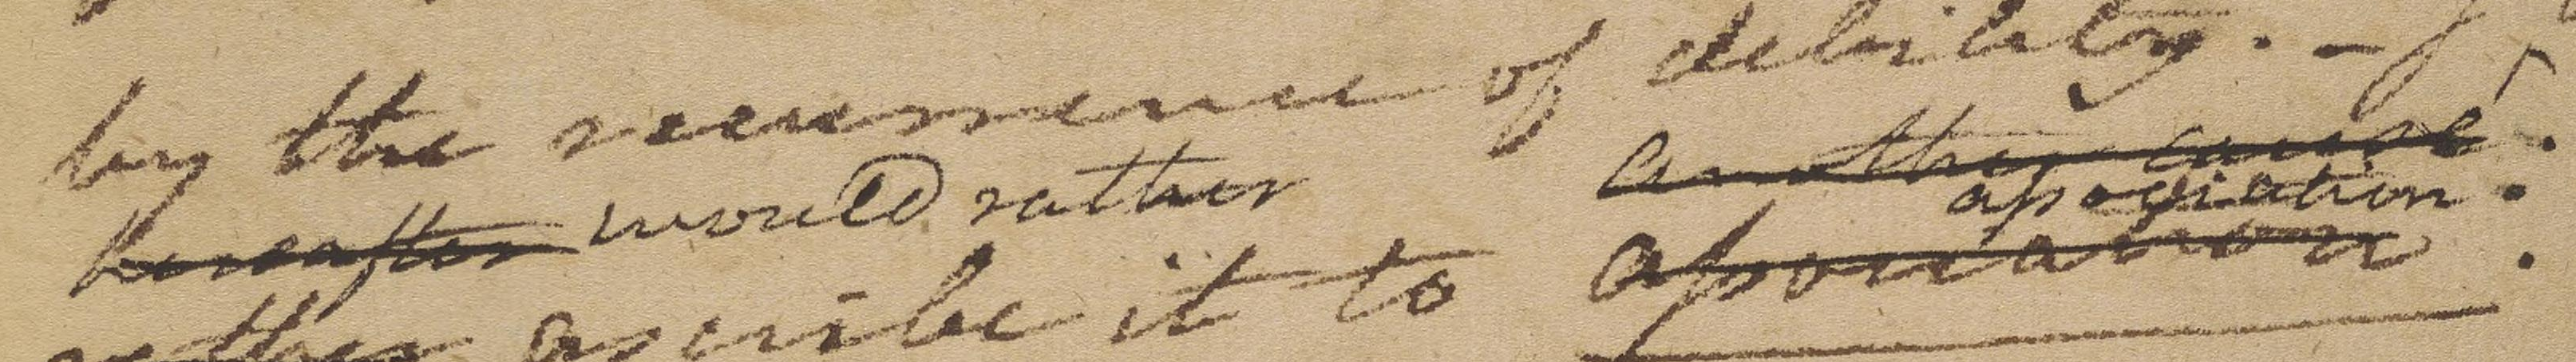[hereafter] would rather [Another cause]
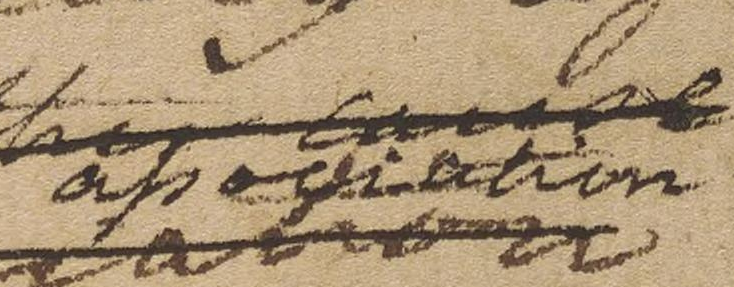association
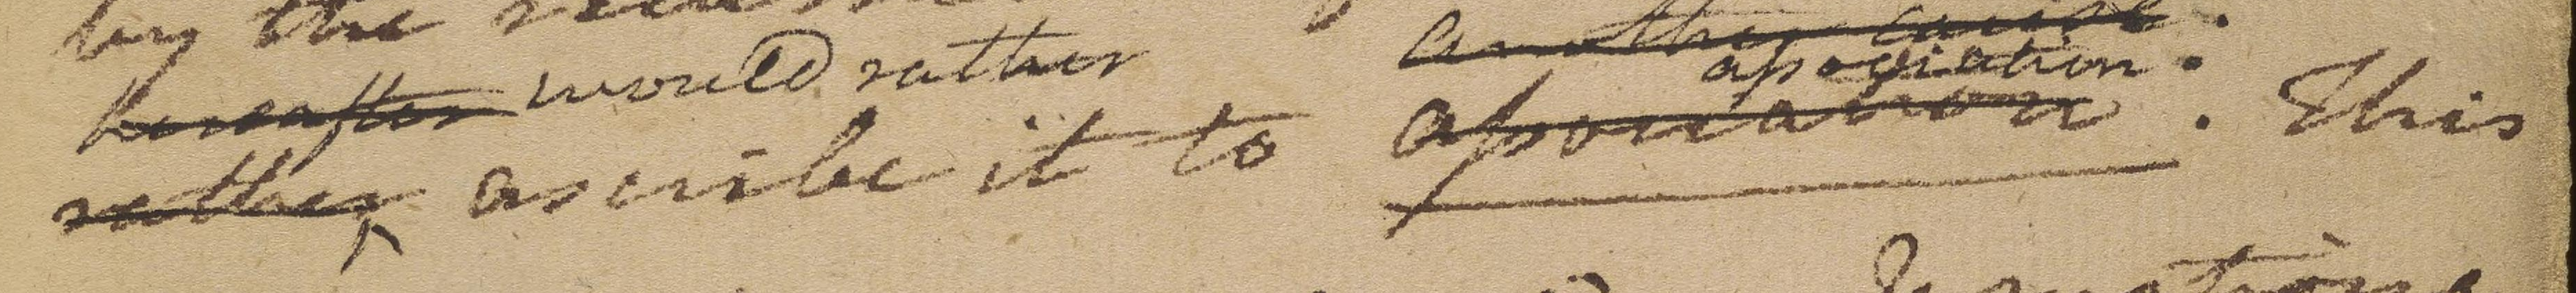[rather] ^ ascribe it to [association]. This
